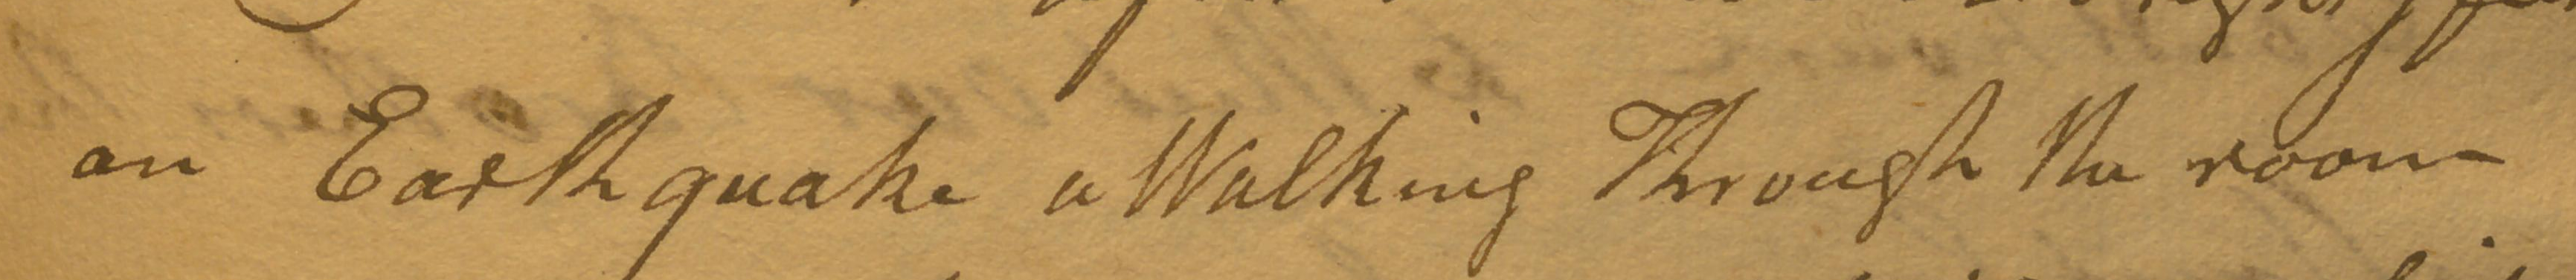an Earthquake a Walking Through the room
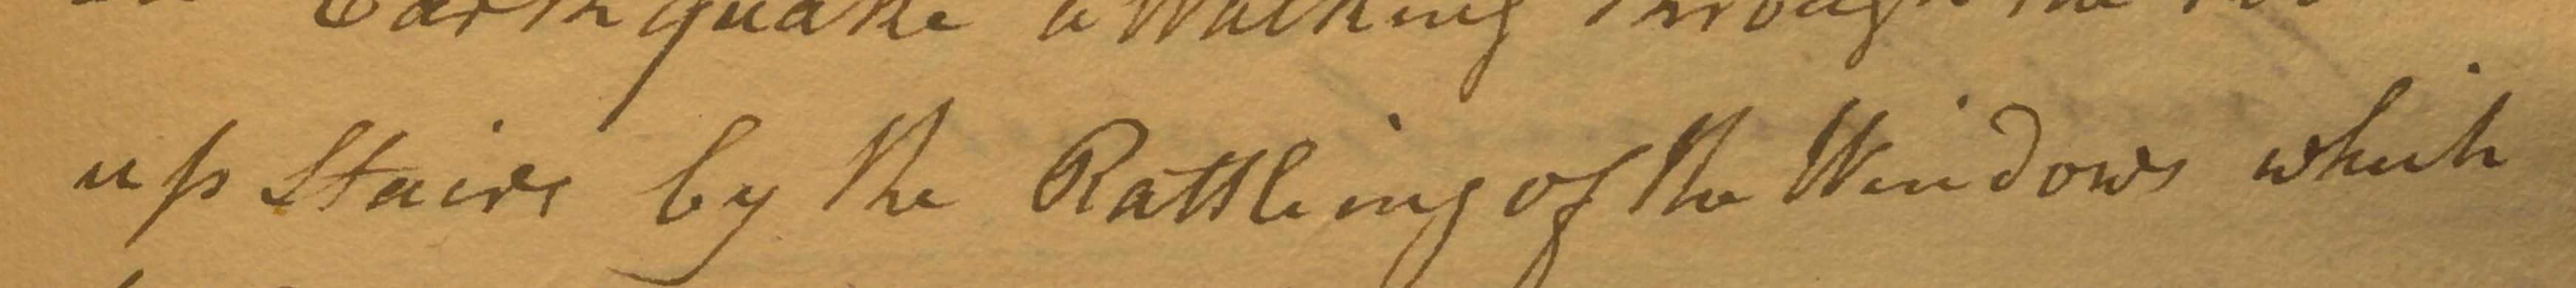up Stairs by the Rattleing of the Windows which
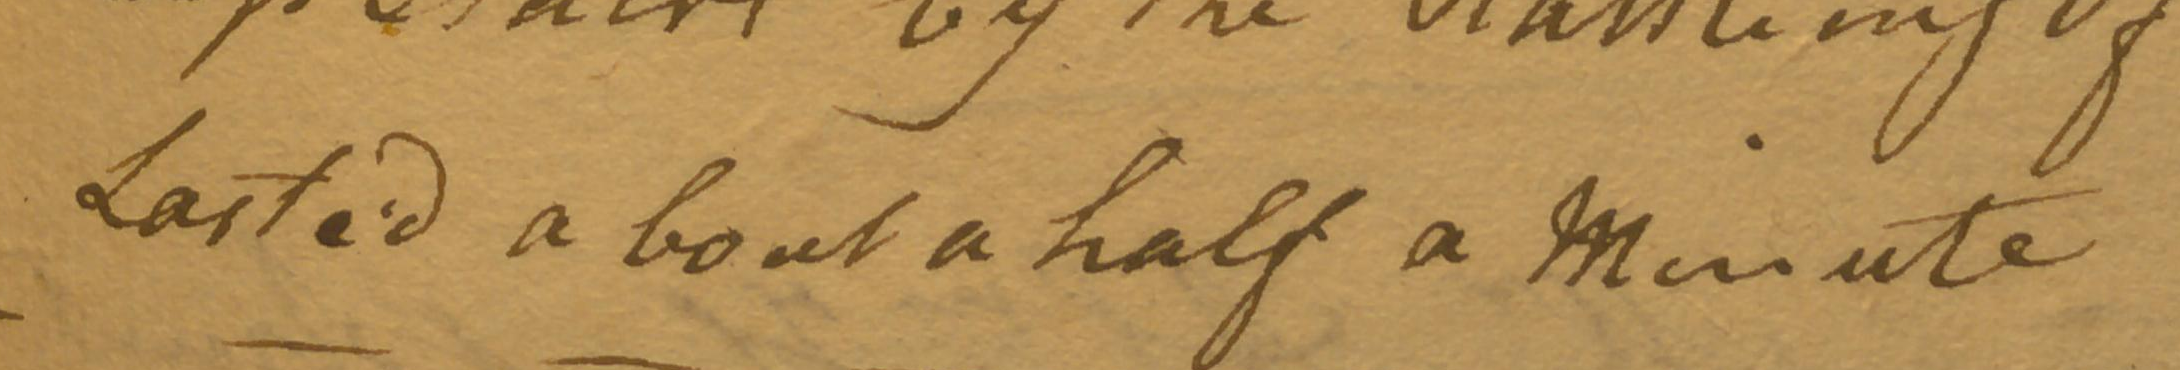Laste'd a bout a half a Minute
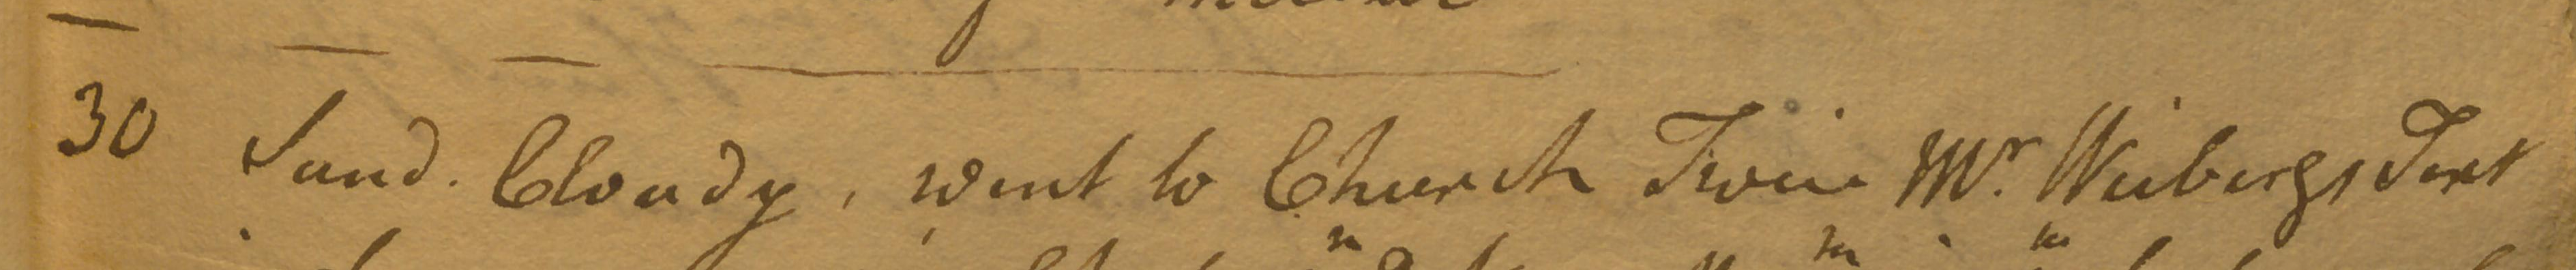30 Sund. Cloudy, went to Church Twice M^r. Weibergs Text
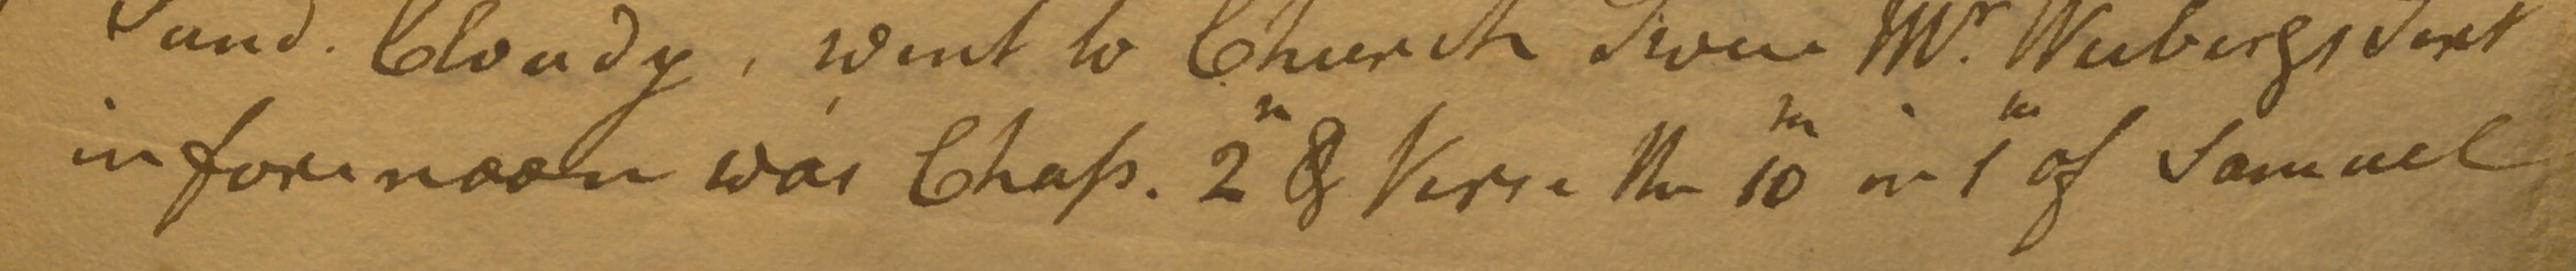in forenoon was Chap. 2^th & Verse the 10^th in 1^th of Samuel
